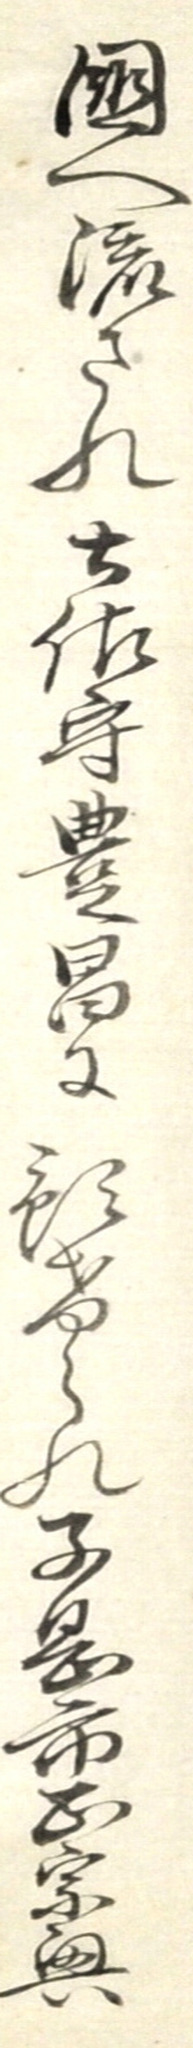国へ流され土佐守豊昌に預けられ子息市正宗興
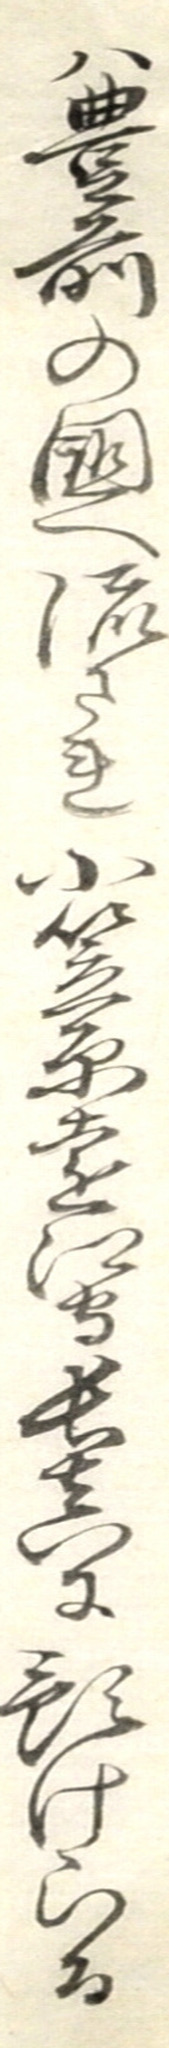は豊前の国へ流され小笠原遠江天性守長真に預けらる
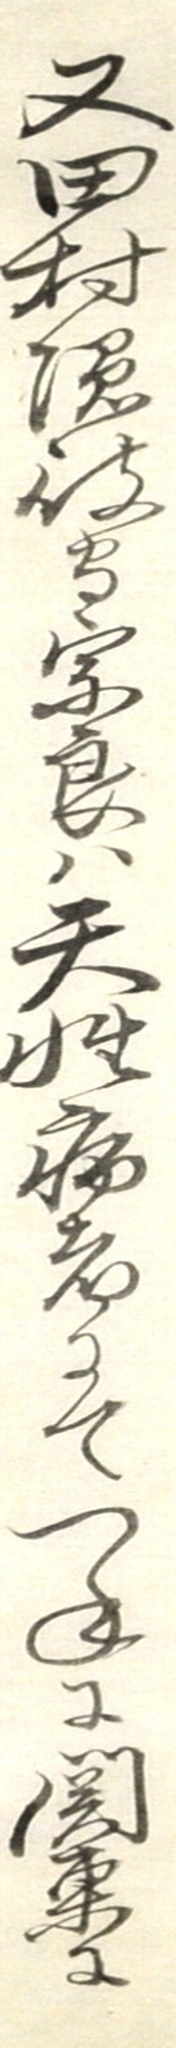又田村隠岐守宗良は天性病者にてつねに関東に
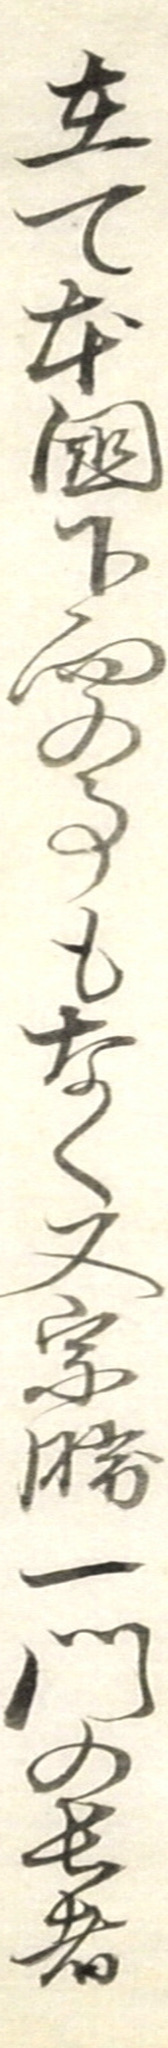在て本国下向の事もなく又宗勝一門の長者
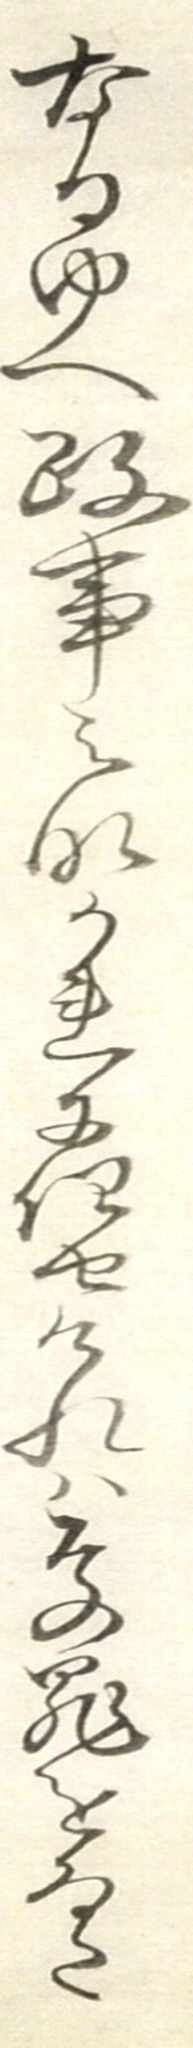なるゆへ政事みなかれに任せけれはその罪をなた
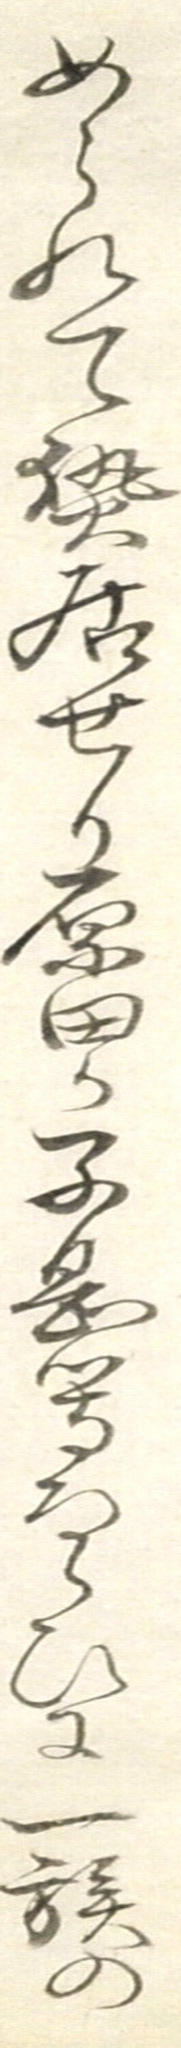められて蟄居せり原田か子息等ならひに一族の
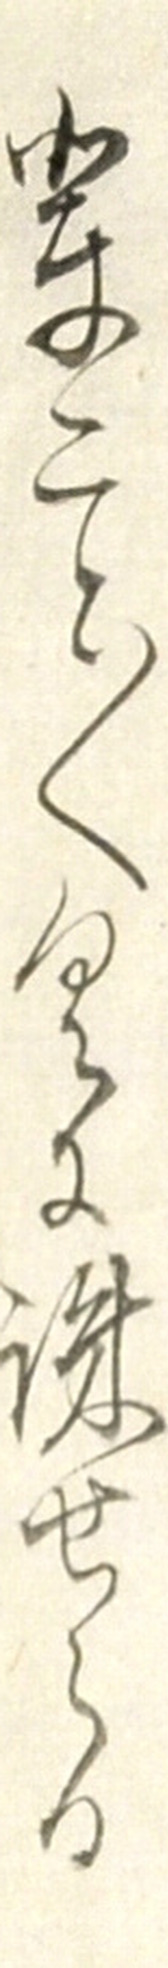輩こと〳〵くに誅せらる

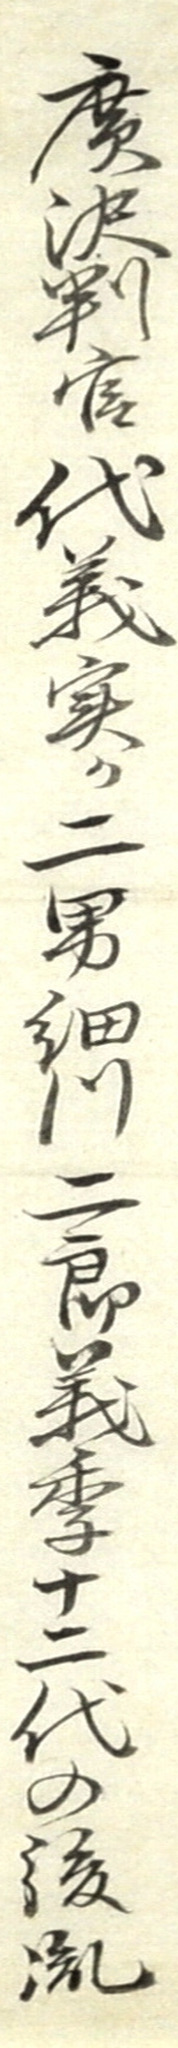広沢判官代義実か二男細川二郎義季十二代の後胤
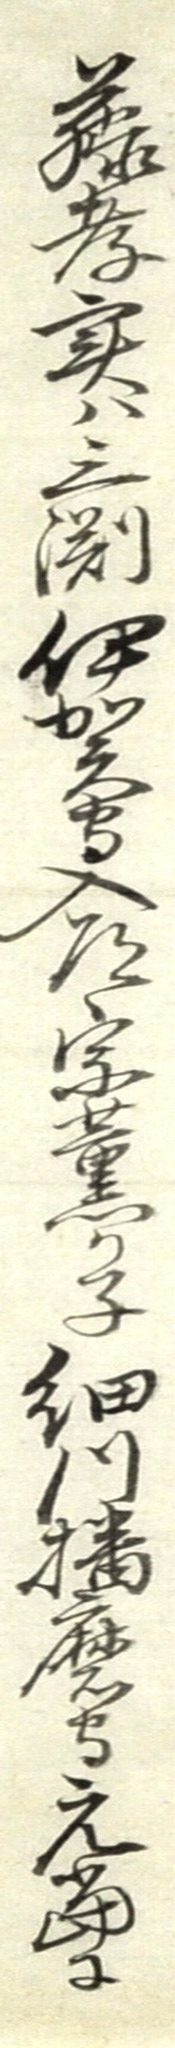藤孝実は三淵伊賀守入道宗薫か子細川播磨守元当に
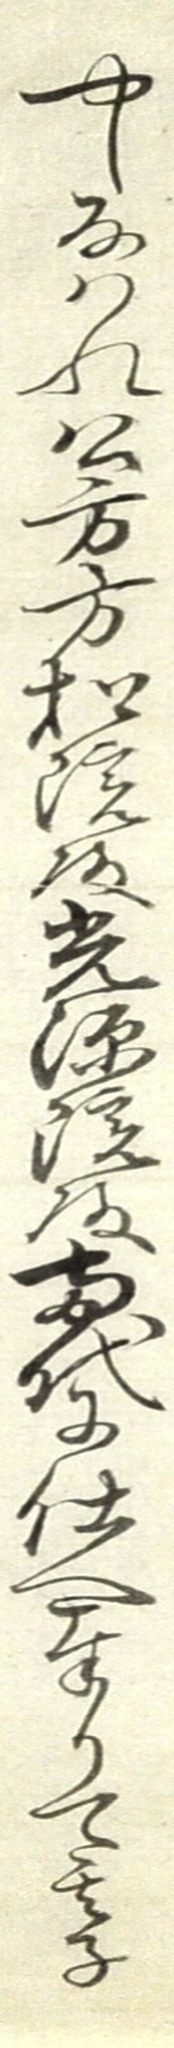やしなはれ公方方松院殿光源院殿当代に仕へ奉りて其子
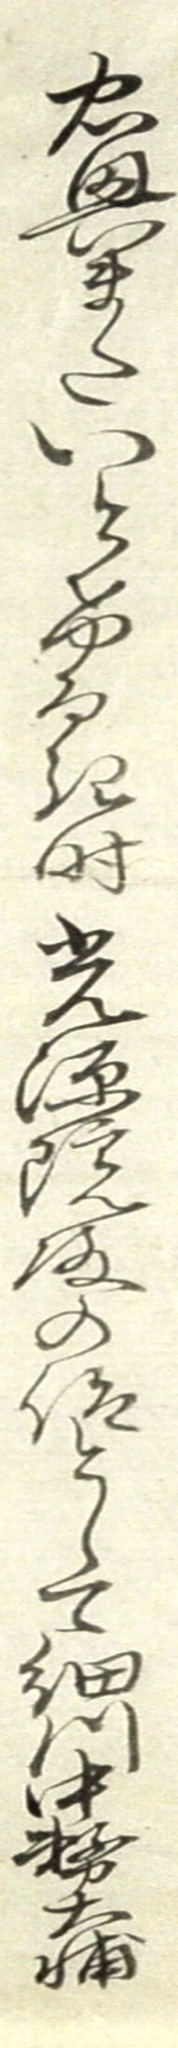忠興またいとけなき時光源院殿の仰として細川中務大輔

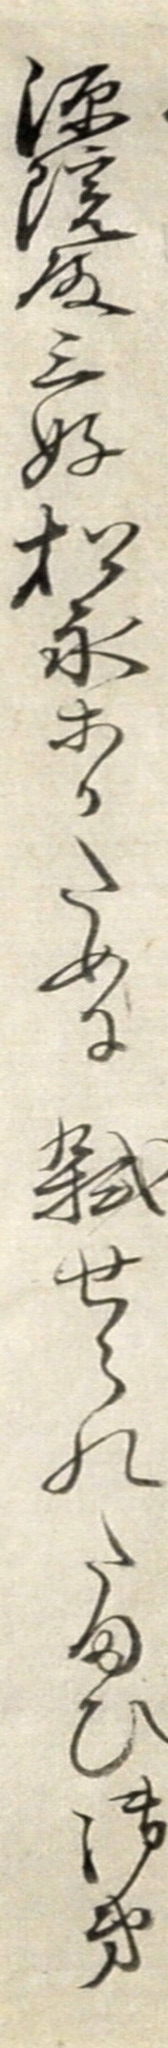源院殿三好松長等かために弑せられたまひ御弟
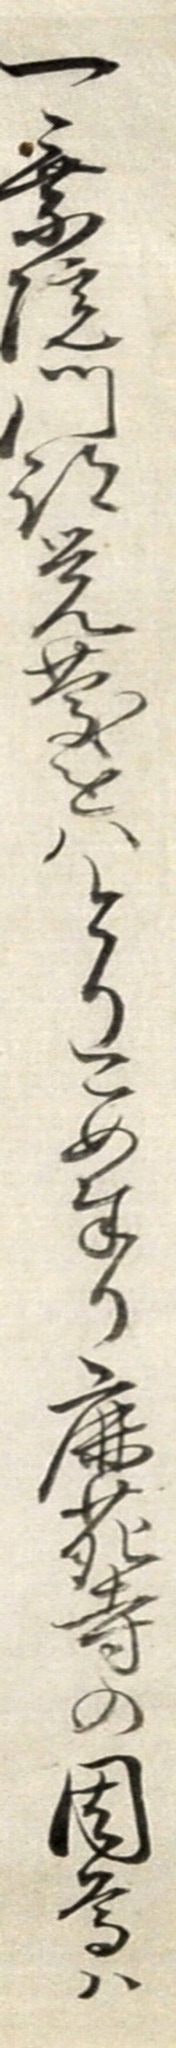一乗院門跡覚慶をはとりこめ奉り鹿苑寺の周尊は
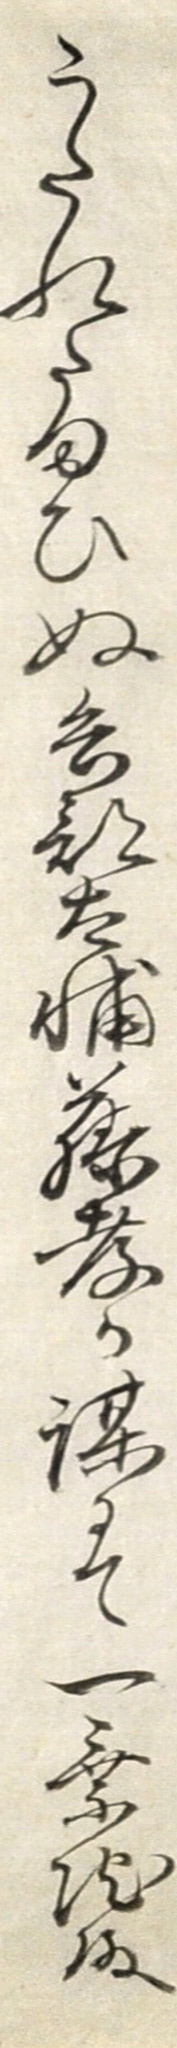うたれたまひぬ兵部太輔藤孝か謀にて一乗院殿
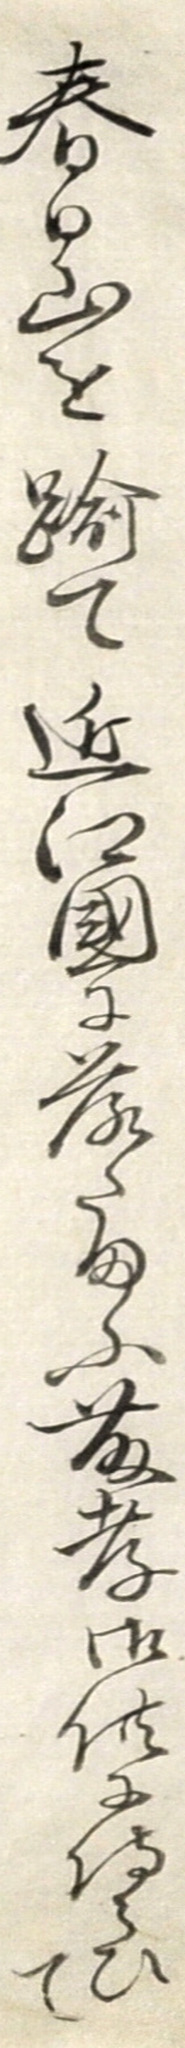春日山を踰て近江国に落たまふ藤孝御供に侍らひて
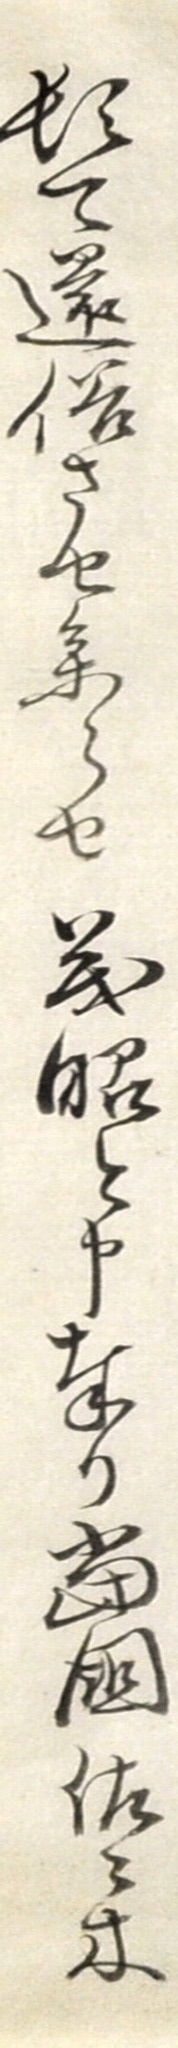頓て還俗させ参らせ義昭と申奉り当国佐々木
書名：藩翰譜（七・下）
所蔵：伊那市立高遠町図書館・合同会社AMANE
